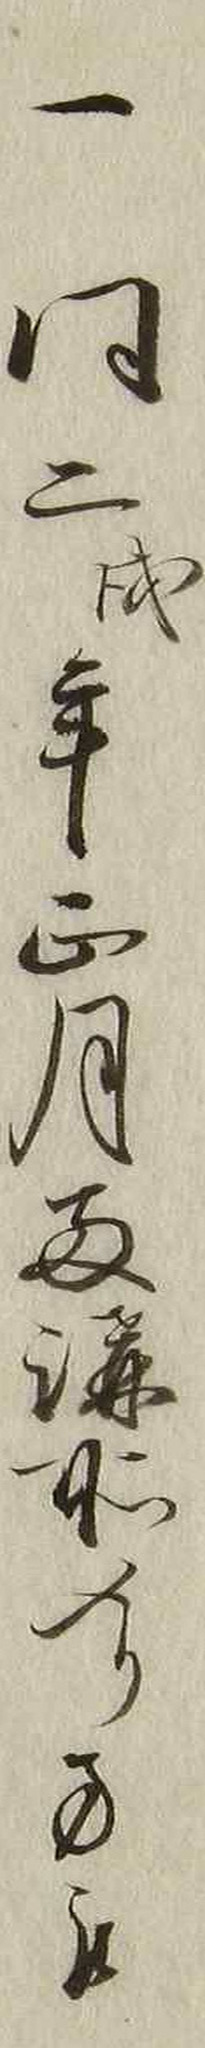一同二戌年正月両講所〆り方
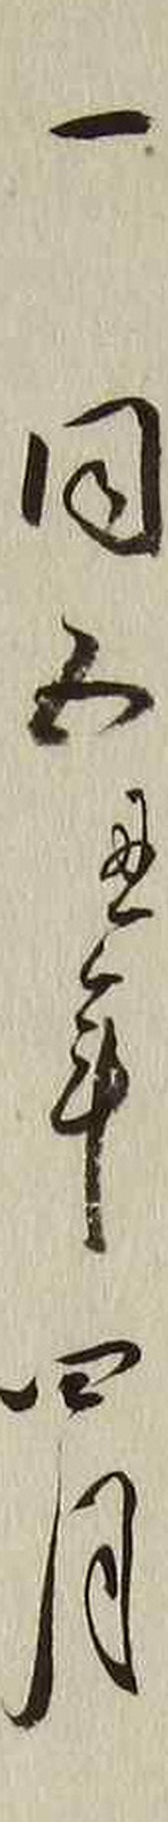一同五丑年四月
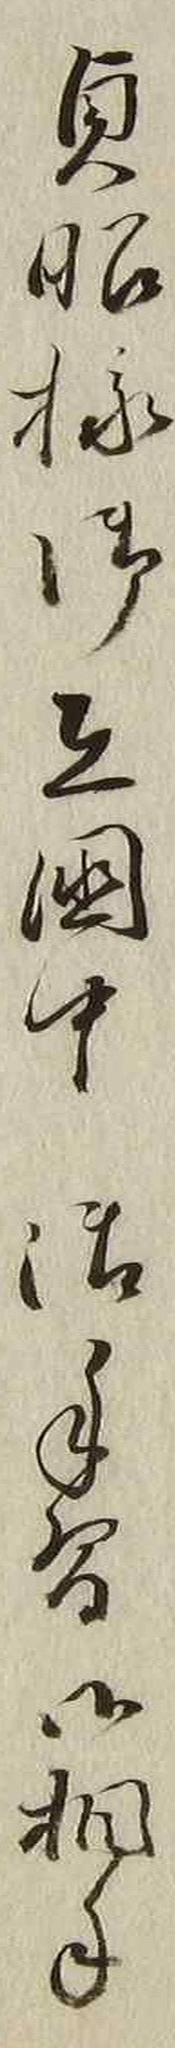貞昭様御在国中御手習御相手
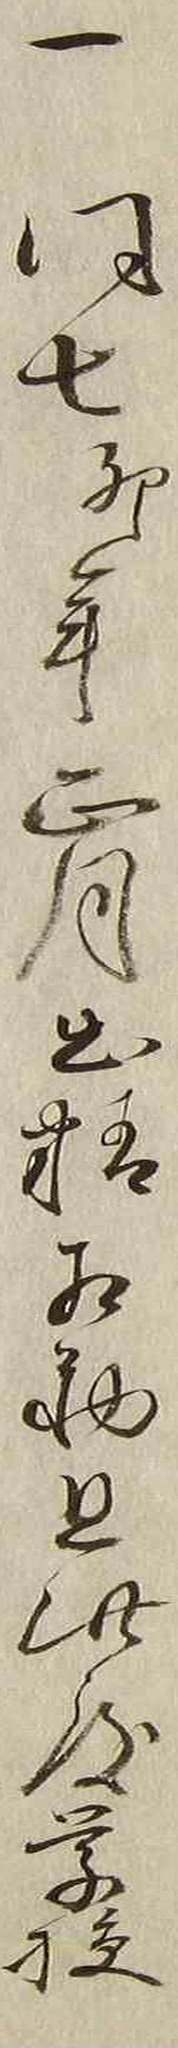一同七卯年正月出精相勤め且つ此度学校

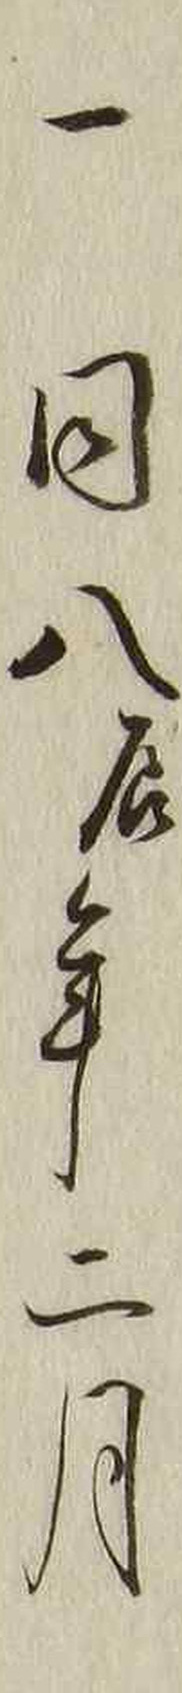一同八辰年二月
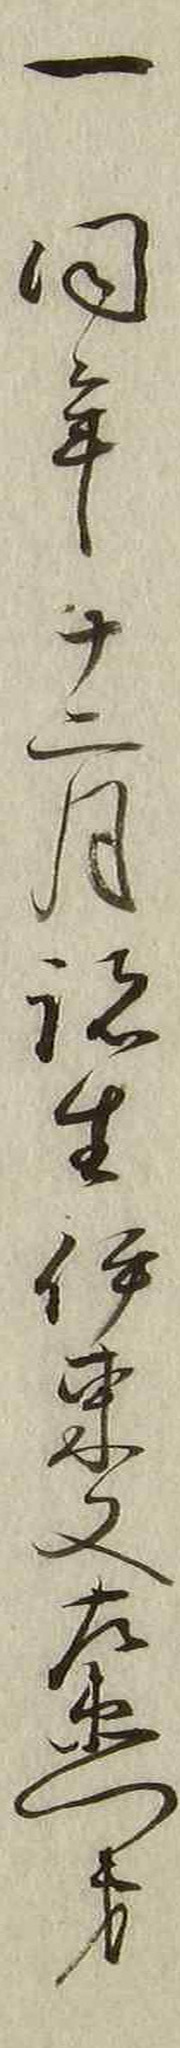一同年十二月諸生伊東又左衛門弟
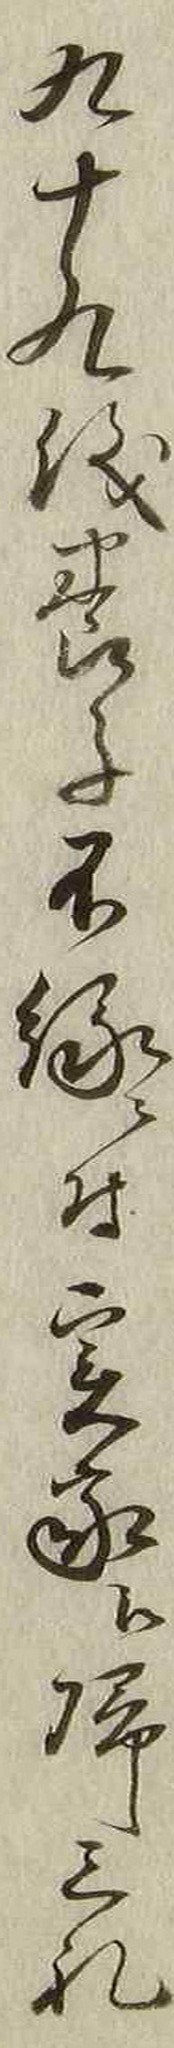九十九儀養子不縁ニ付き実家へ帰り三礼
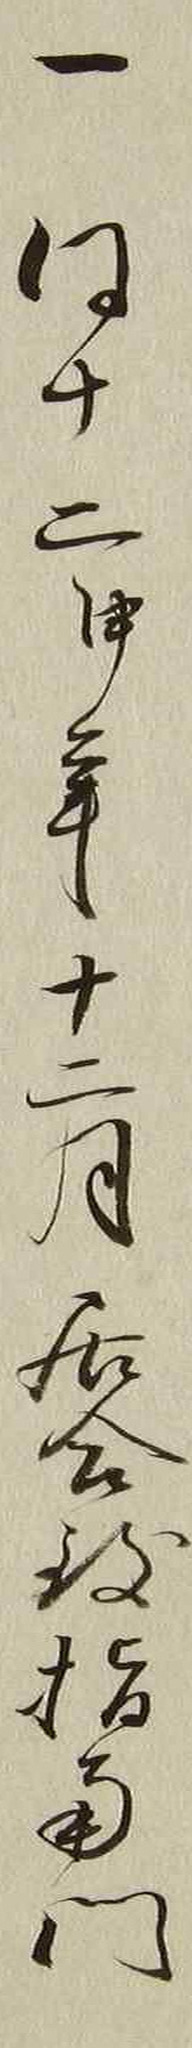一同十二月申年十二月居合指南致し門
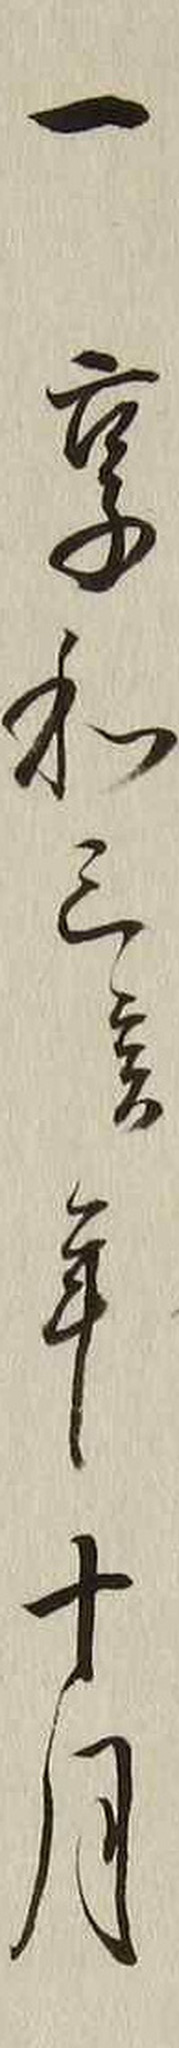一享和三亥年十月
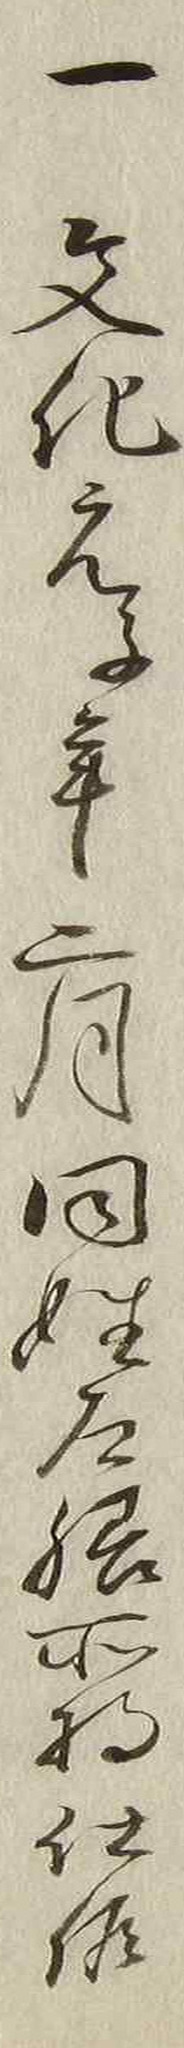一文化元子年二月同性左膳所持仕り候
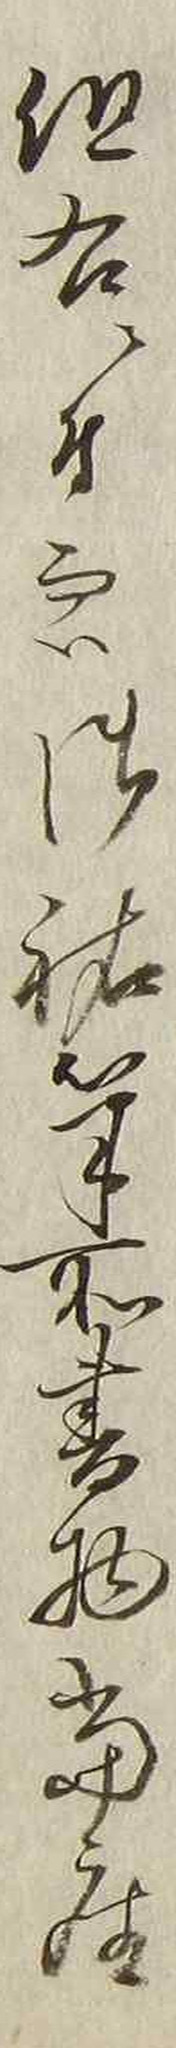但し右ニ付てㇵ御祐筆所書物当座

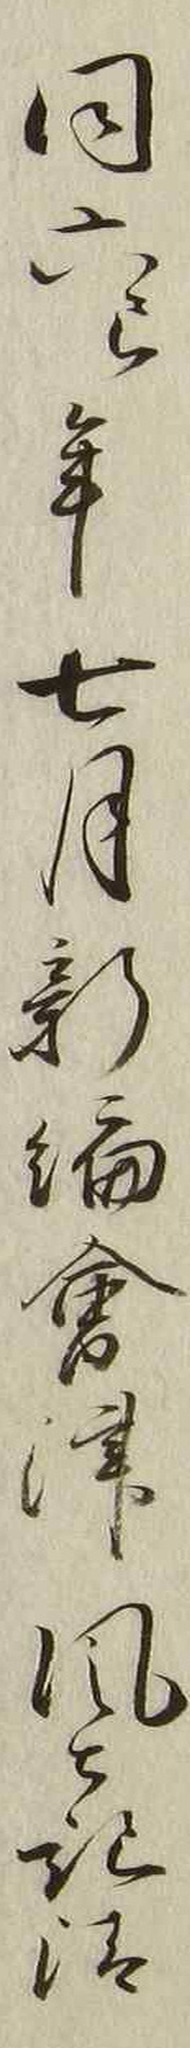一同六巳年七月新編会津風土記清
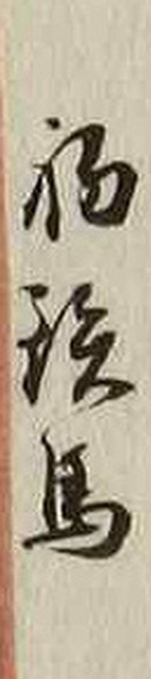初鉄馬
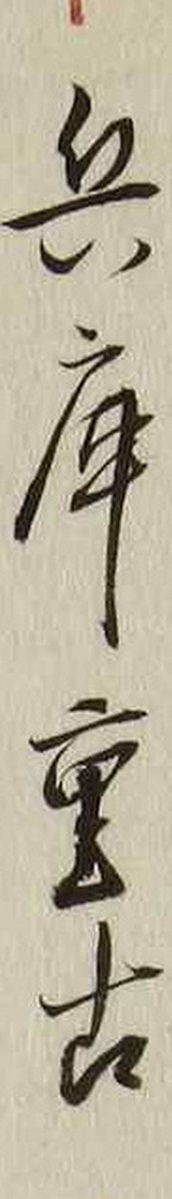兵庫重古
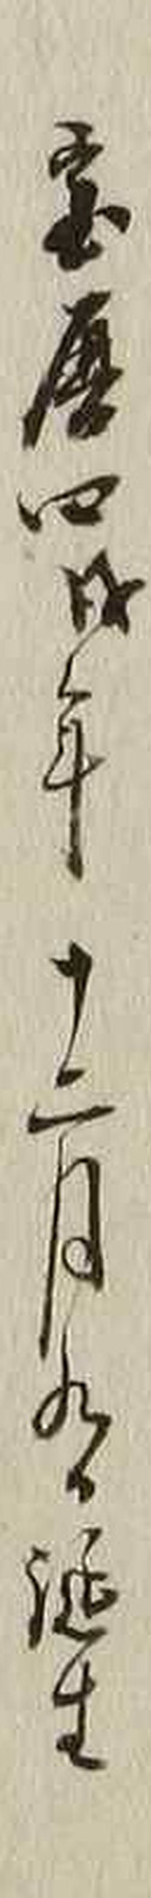宝暦四戌年十二月九日誕生
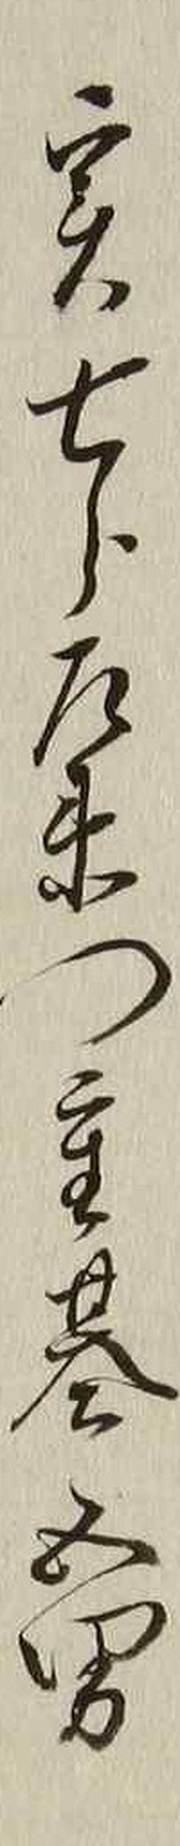実七郎左衛門重基五男
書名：諸士系譜　巻之20　い之部20
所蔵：会津若松市立会津図書館
